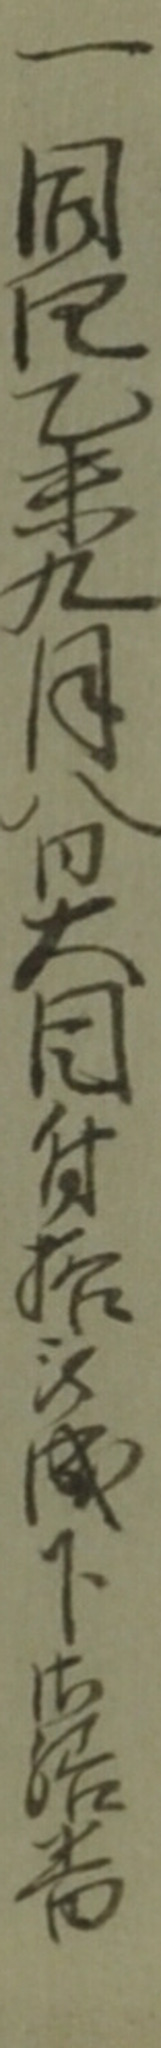一同四乙未九月八日大目付格被成下御膳番
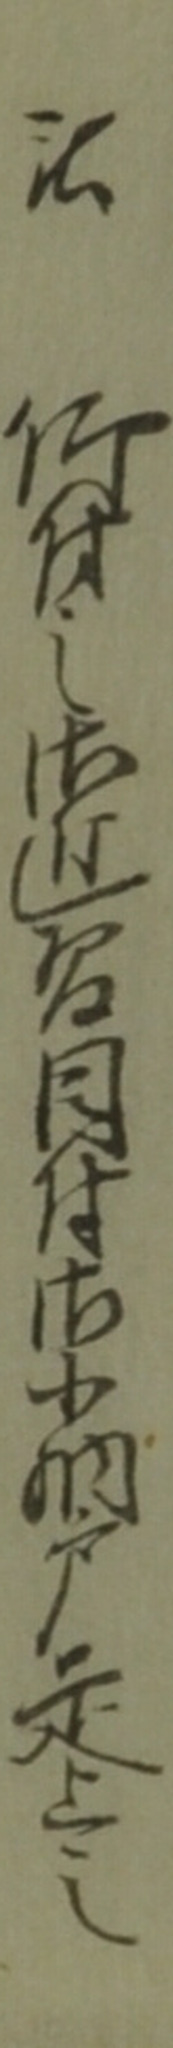被仰付之御近習目付御小納戸是迄之
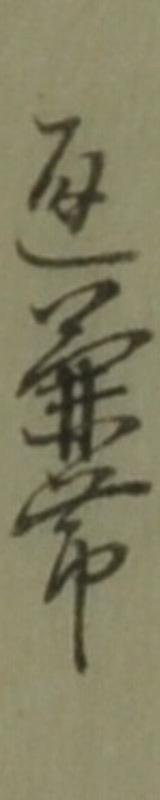通兼帯
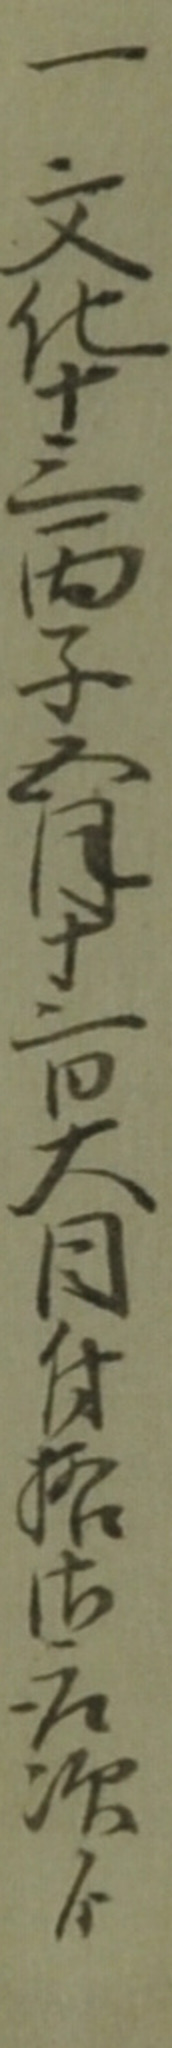一文化十三丙子五月十三日大目付格御取次ゟ
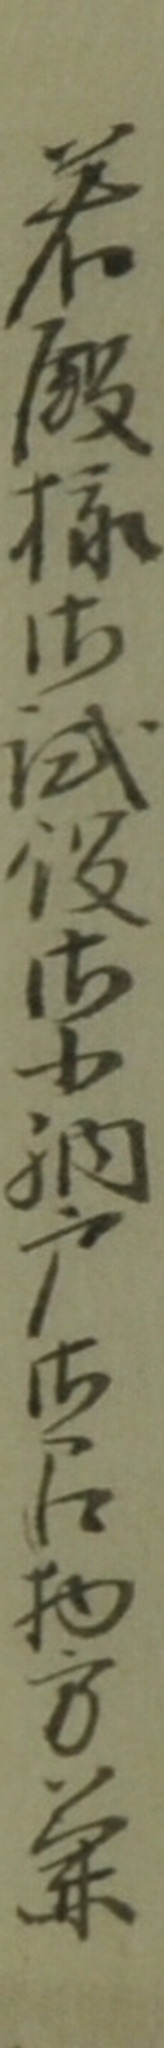若殿様御試役御小納戸御召物方兼
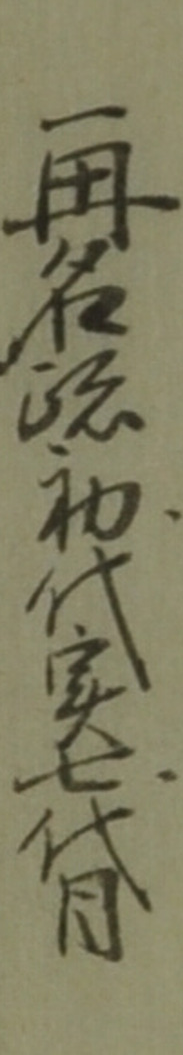再名跡初代実七代目
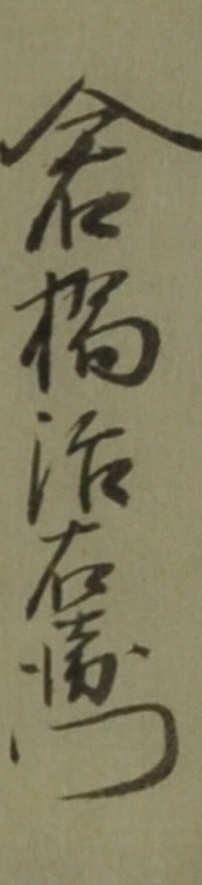倉橋治右衛門
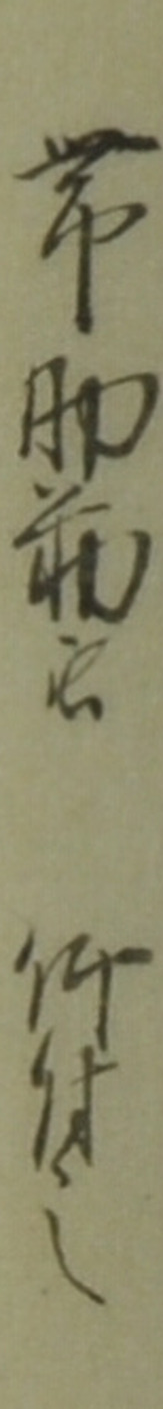帯助勤被仰付之

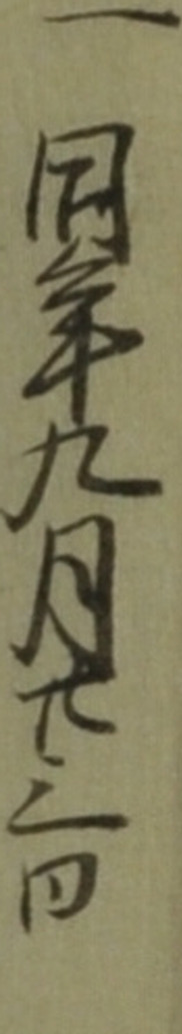一同年九月廿三日
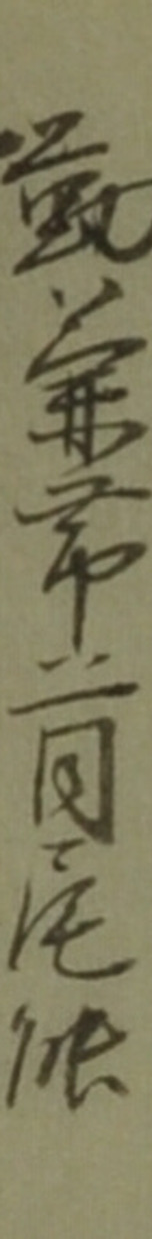勤兼帯首尾能
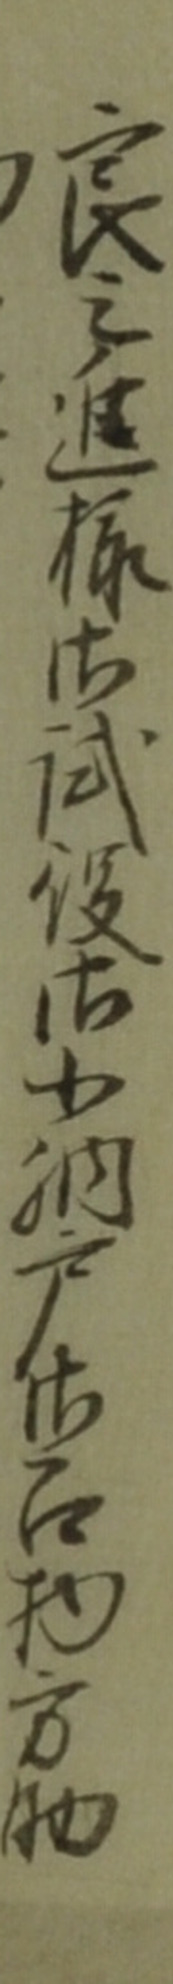良之進様お御試役御小納戸御召物方助
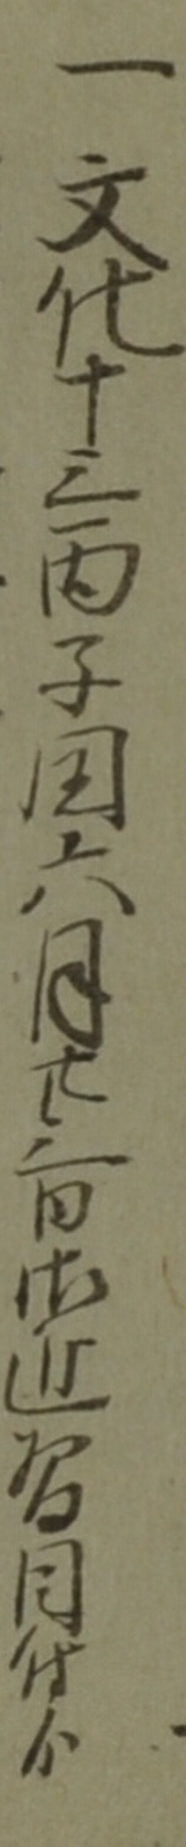一文化十三丙子閏六月廿三日御近習目付ゟ
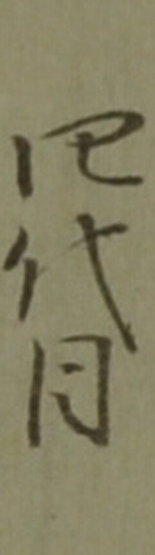四代目
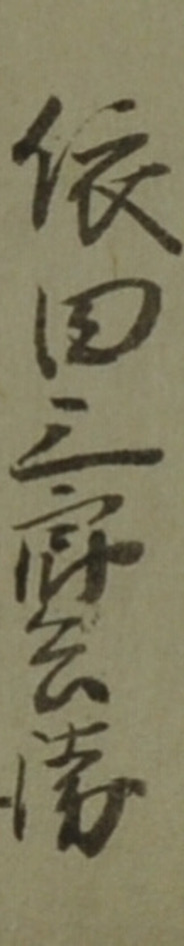依田三郎兵衛
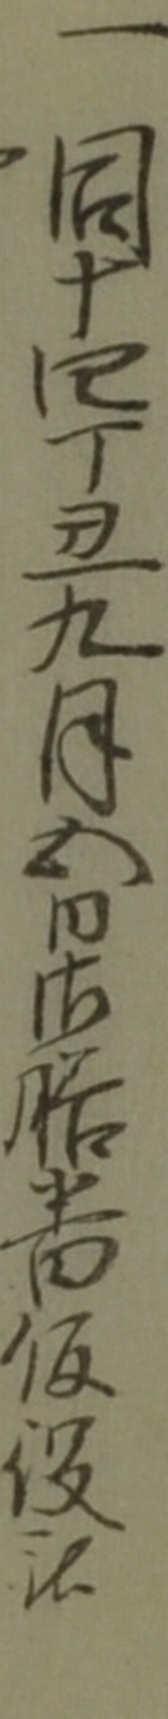一同十四丁丑九月五日御膳番仮役被
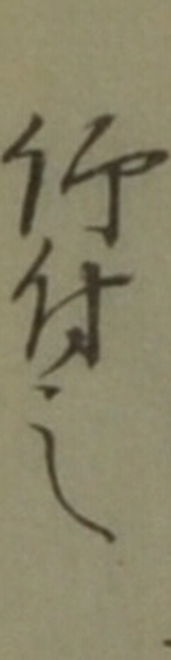仰付之
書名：諸御役代々録（四）
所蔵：伊那市立高遠町図書館・合同会社AMANE
